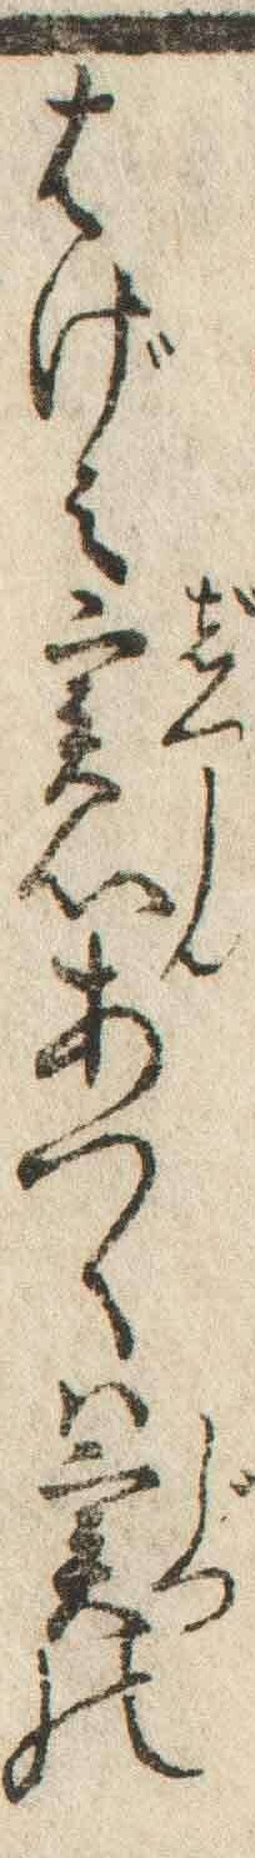はげみ実心あつくは実の
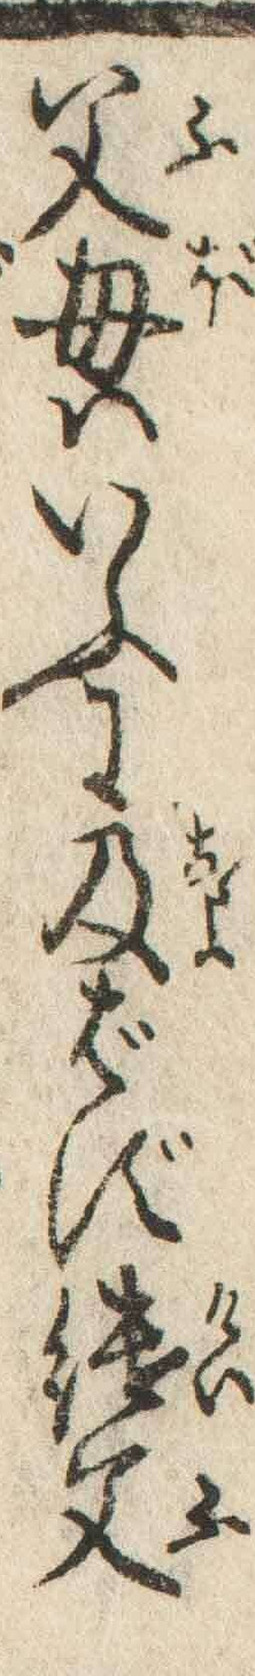父母はいふに及ばず継父
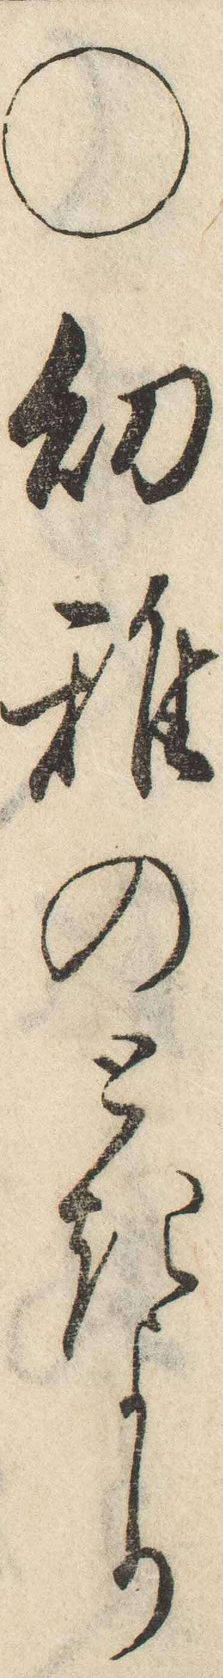〇幼稚のときより
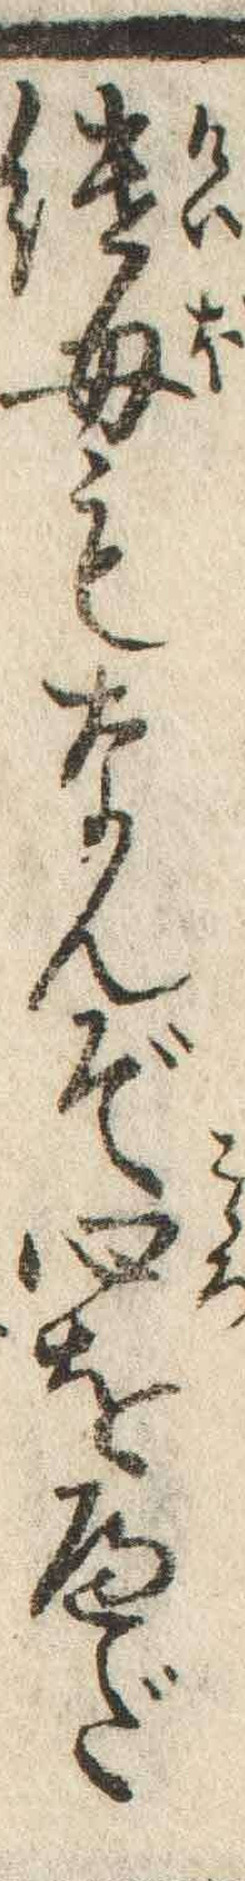継母もなんぞ心をへだ
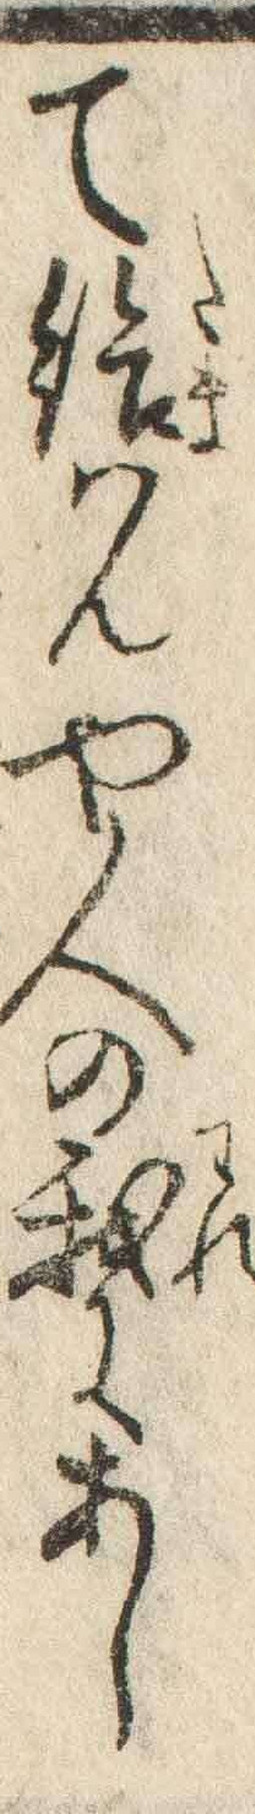て給はんや人の我にあし
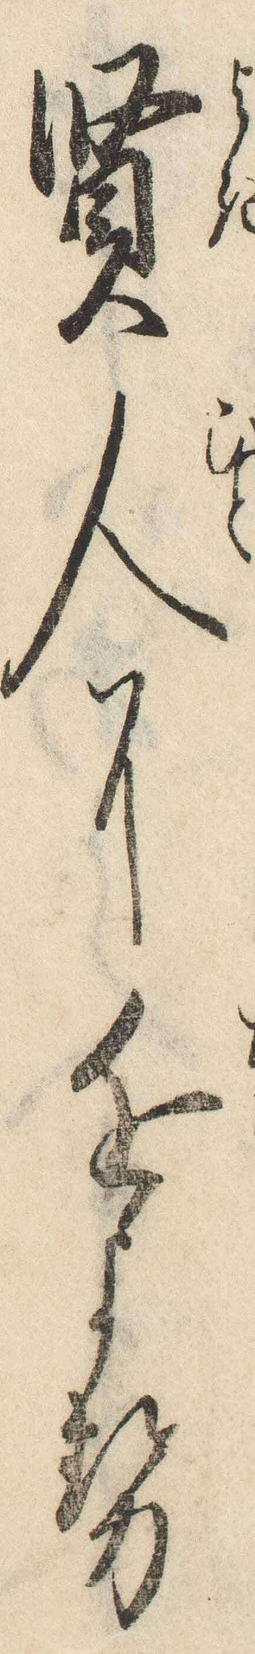賢人に近よせ
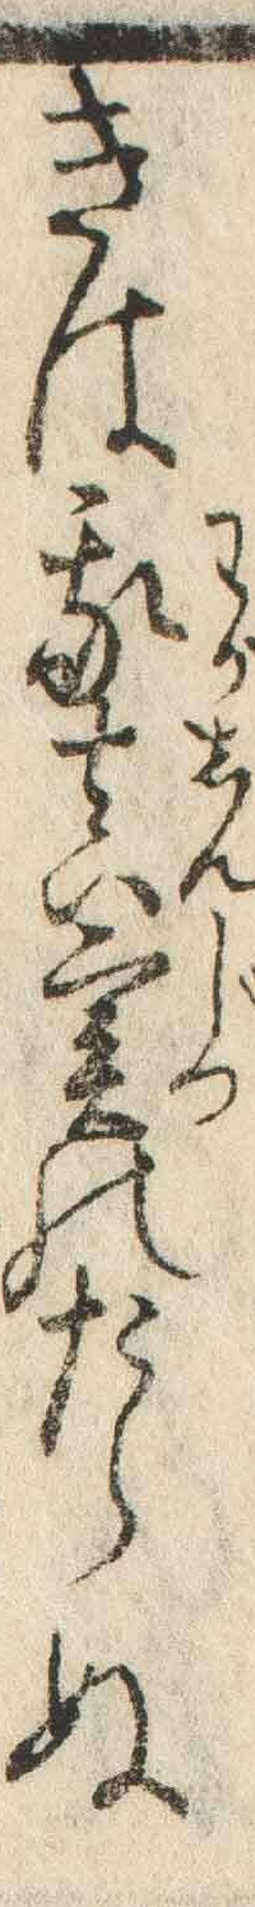きは我真実のたらぬ
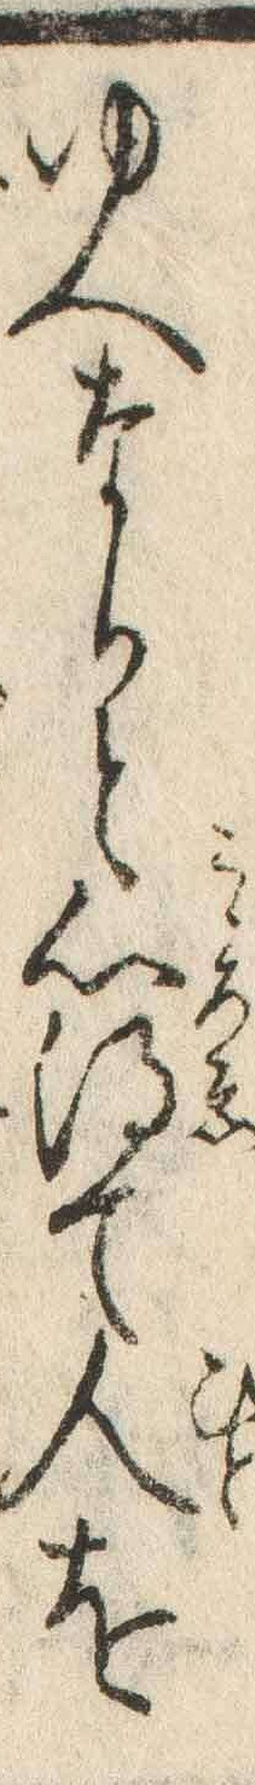ゆへなりと心得て人を
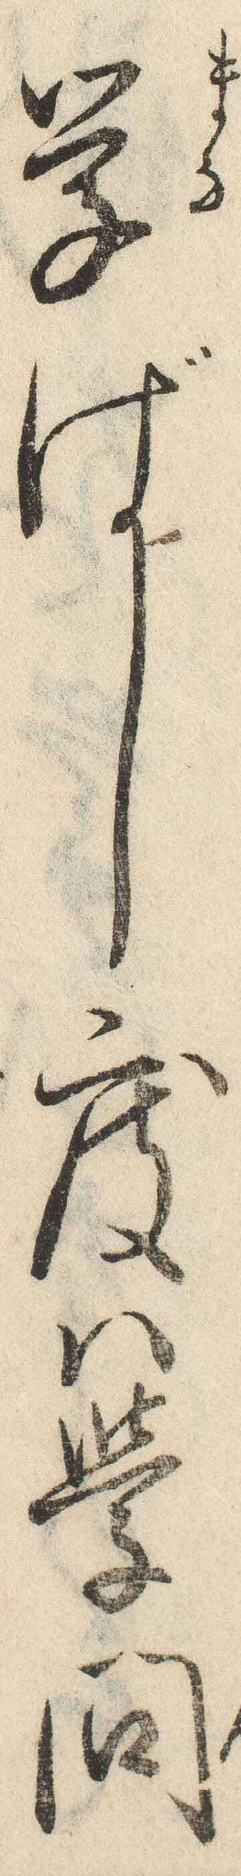学ばし度は学問
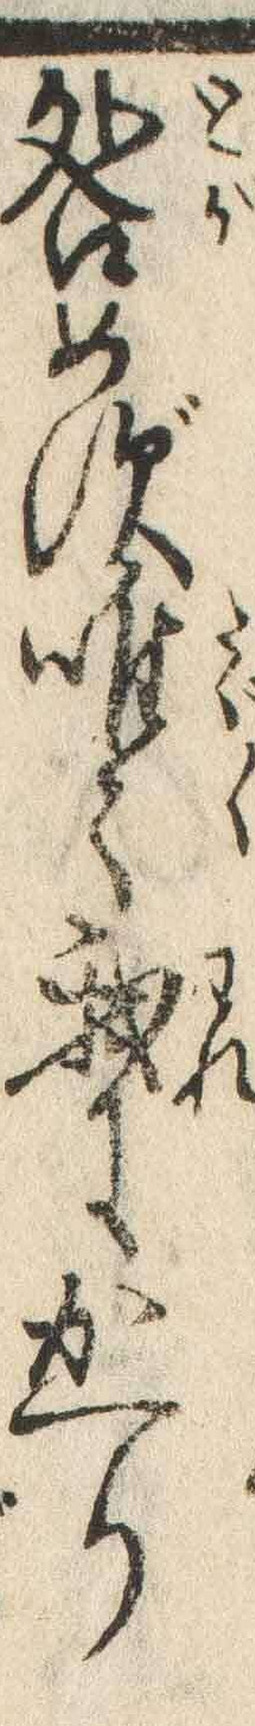咎めず唯々我にかへり
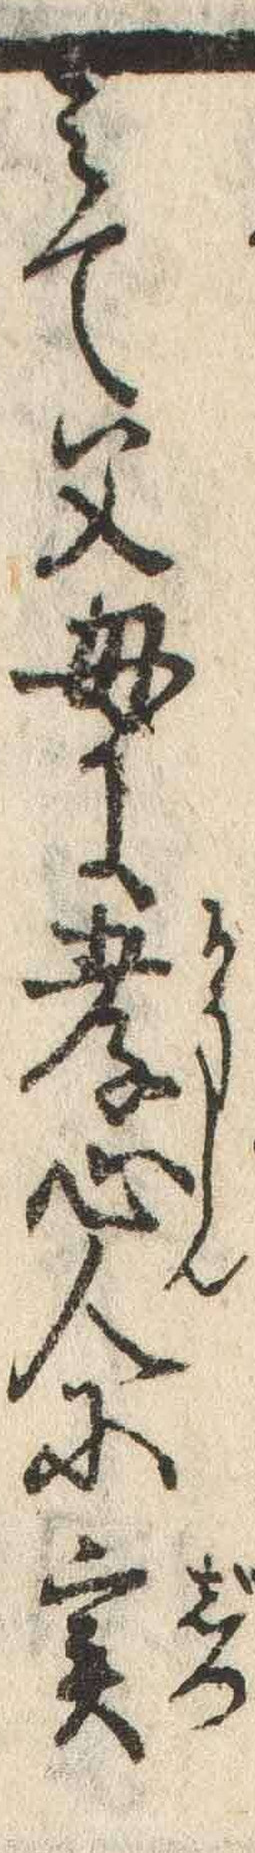みて父母に孝心人に実
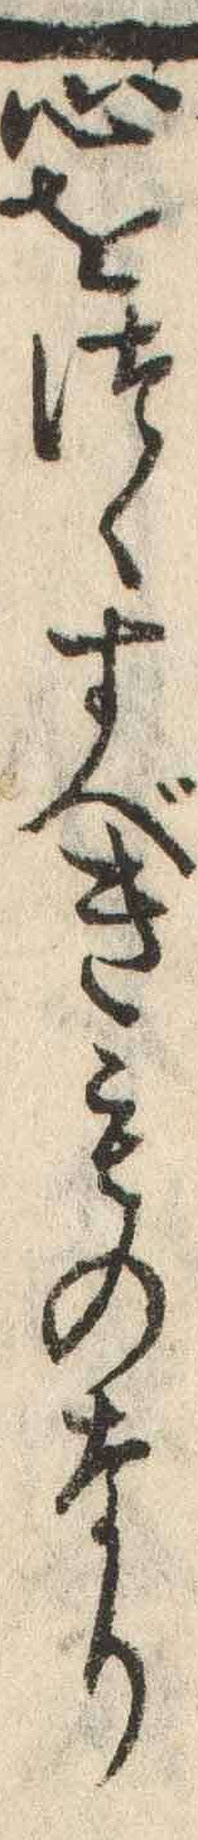心をつくすべきものなり
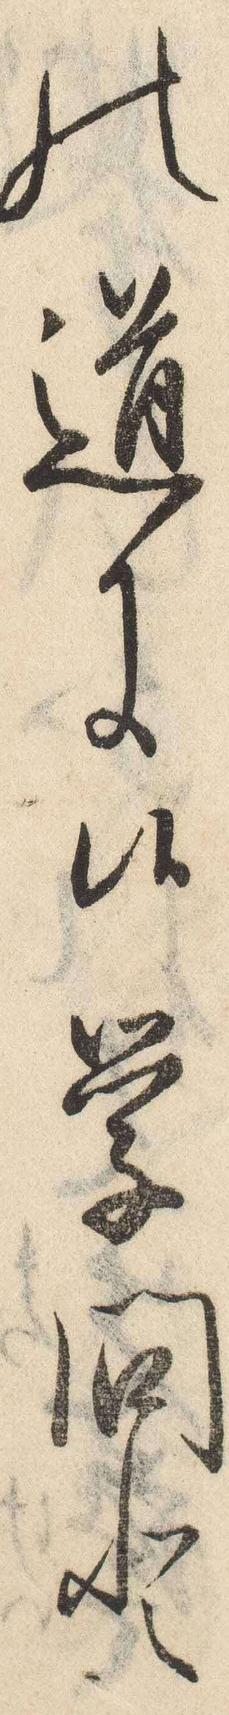の道に候学問と
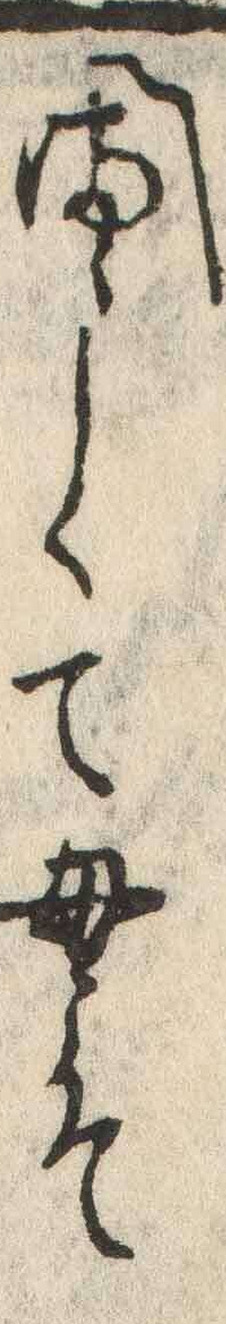〽まゝしくて母こそ
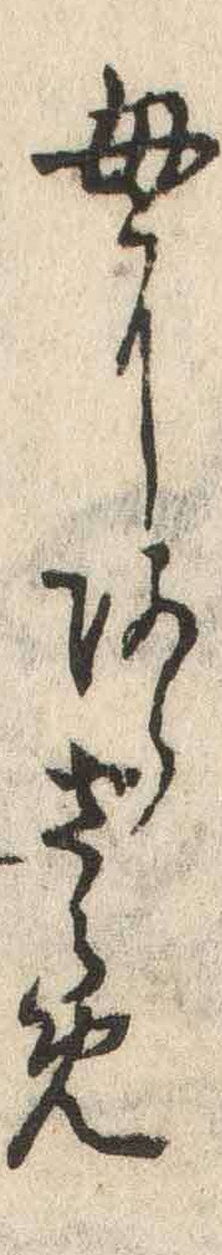母にあらざらめ
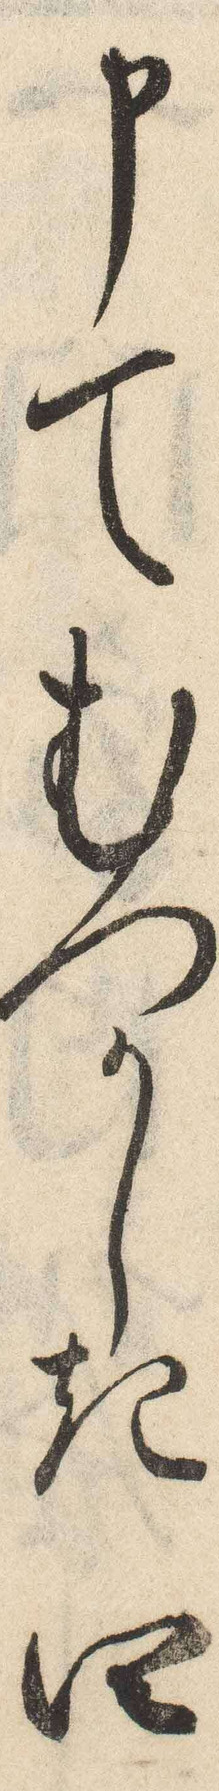申てむつかしき四
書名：撫育草
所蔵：東京学芸大学附属図書館 国文学研究資料館
